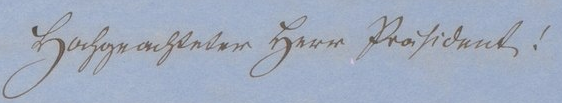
Hochgeachteter Herr Präsident!
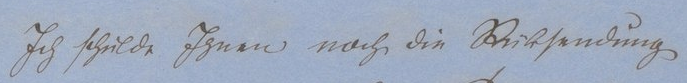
Ich schulde Ihnen noch die Rüksendung
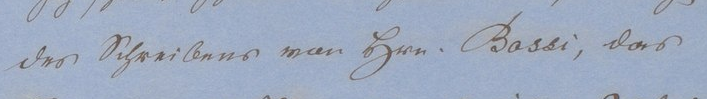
des Schreibens von Hrn. Bossi, das
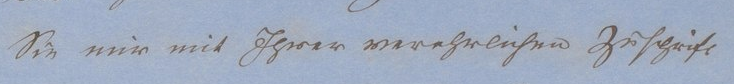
Sie mir mit Ihrer verehrlichen Zuschrift
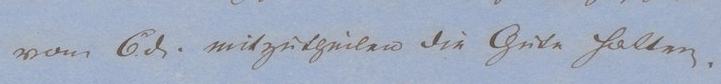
vom 6.d. mitzutheilen die Güte hatten.
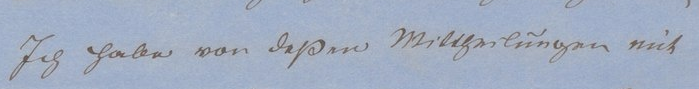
Ich habe von deßen Mittheilungen mit
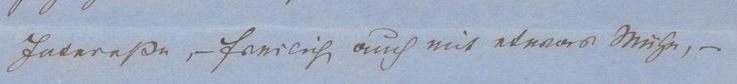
Intereße, – freilich auch mit etwas Mühe, –
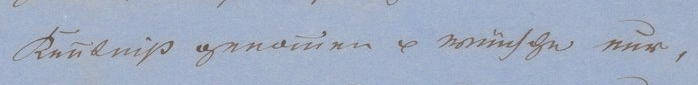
Kenntniß genommen & wünsche nur,
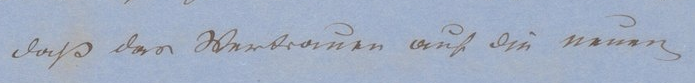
daß das Vertrauen auf die neuen
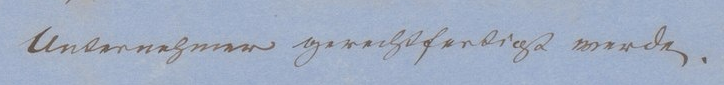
Unternehmer gerechtfertigt werde.
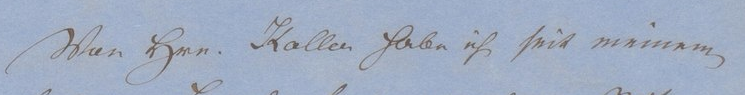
Von Hrn. Koller habe ich seit meinem
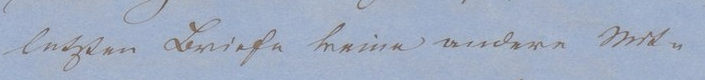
letzten Briefe keine andere Mit-
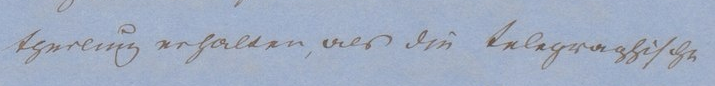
theilung erhalten, als die telegraphische
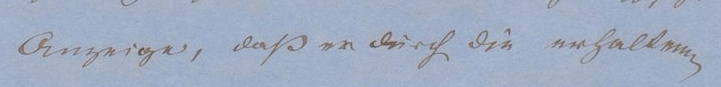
Anzeige, daß er durch die erhaltenen
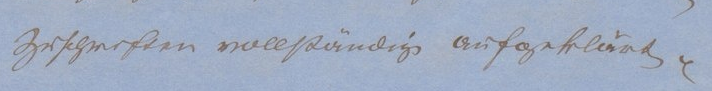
Zuschriften vollständig aufgeklärt &
